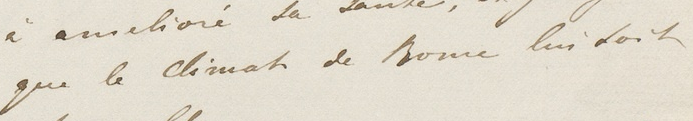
que le climat de Rome lui soit
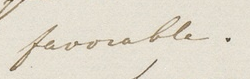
favorable.
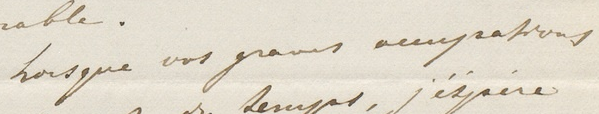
Lorsque vos graves occupations
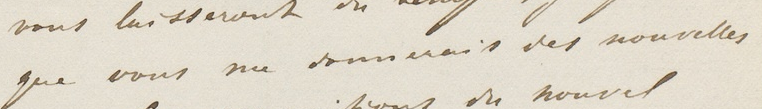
que vous me donnerais des nouvelles
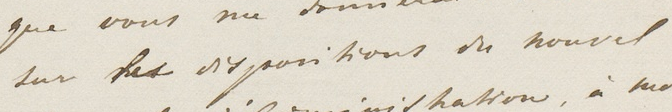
sur les dispositions du nouvel
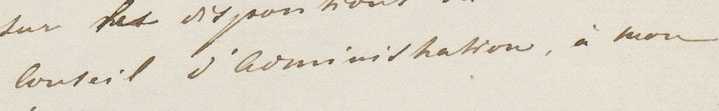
Conseil d'Administration, à mon
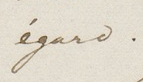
égard.
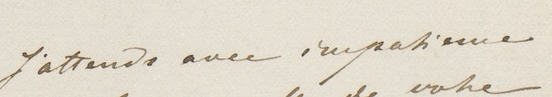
J'attends avec impatience
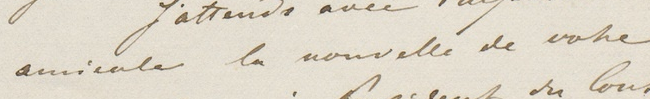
amicale la nouvelle de votre
